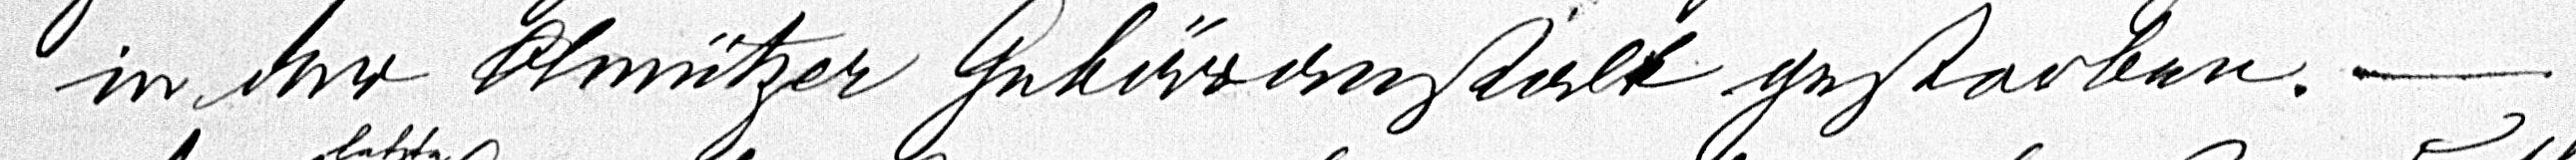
in der Olmützer Gebäranstalt gestorben.
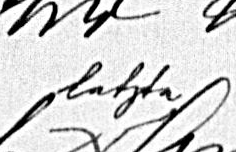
letzte
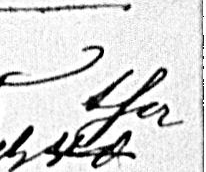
tha
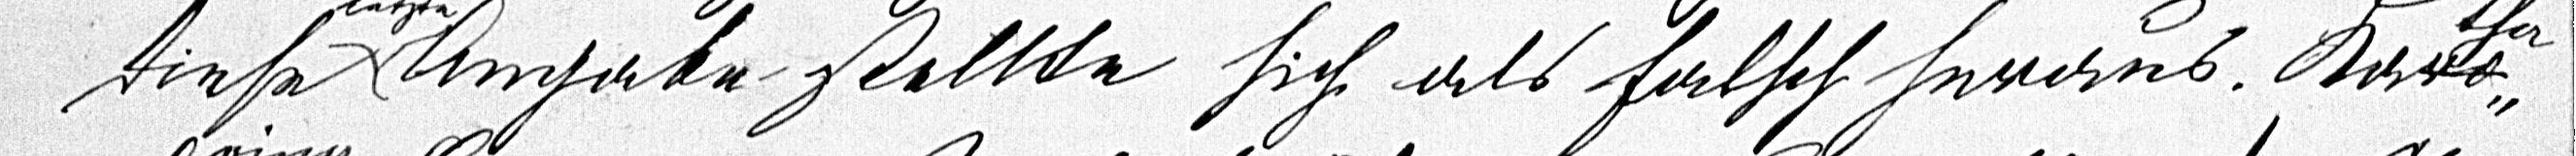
Diese Angabe stellte sich als Falsch heraus. Ka¬
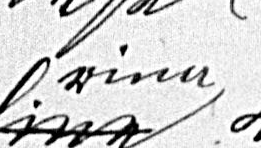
rina
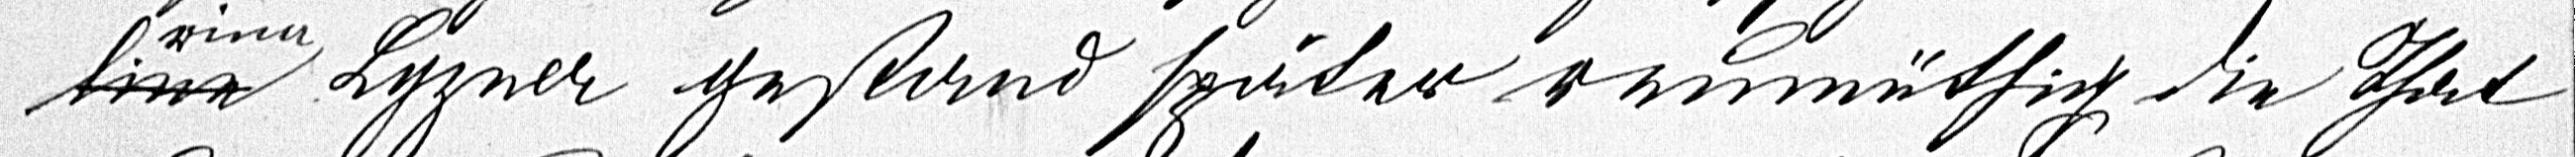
Lyzner gestand später reumüthig die That
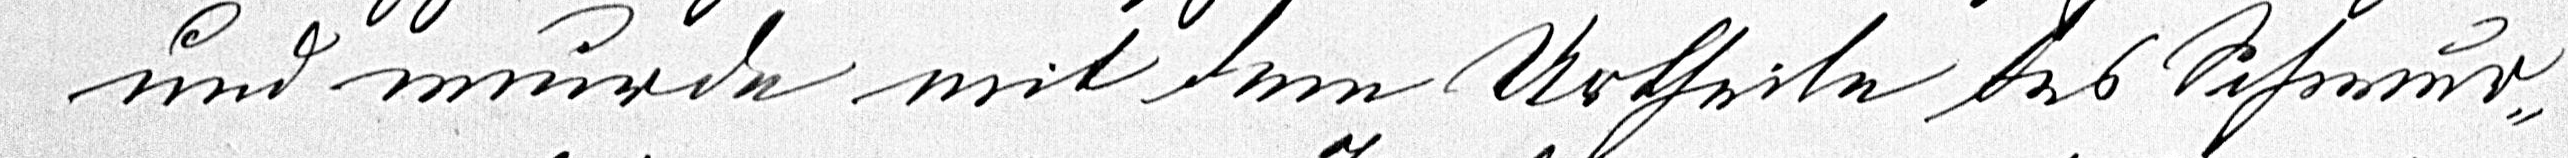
und wurde mit dem Urtheile des Schwur¬
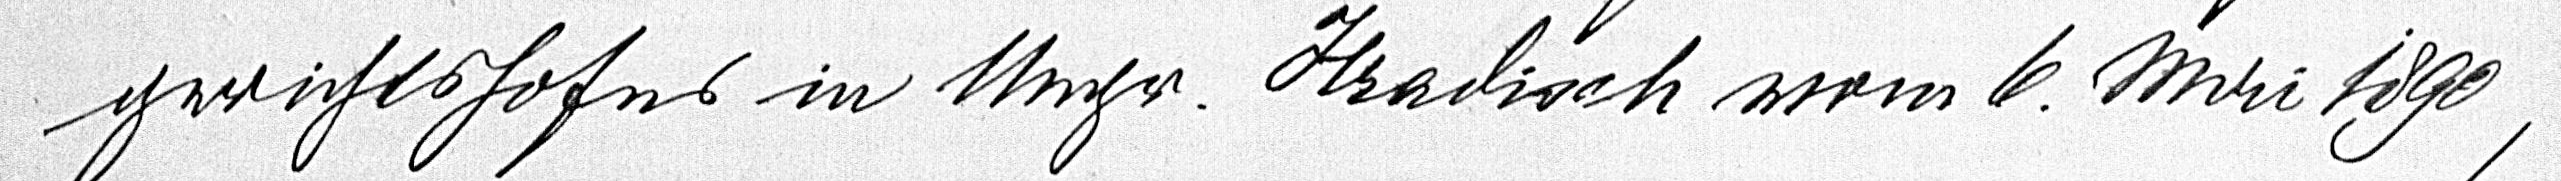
gerichtshofes in Ungr. Hradisch vom 6. Mai 1890
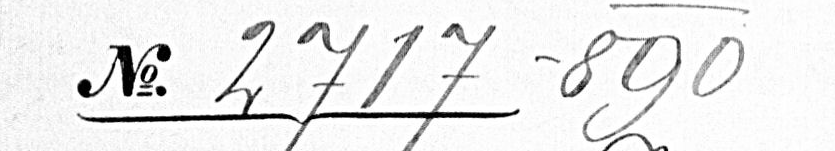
N° 2717-890
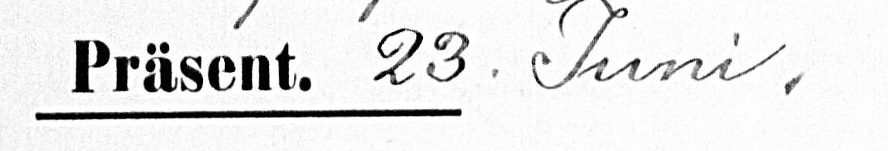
Präsent. 23. Juni.
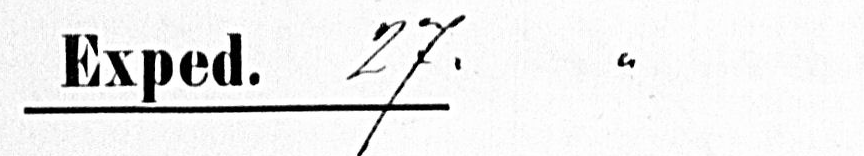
Exped. 27. Juni
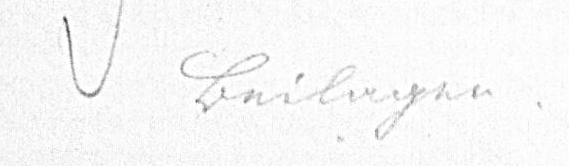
Beilagen.
